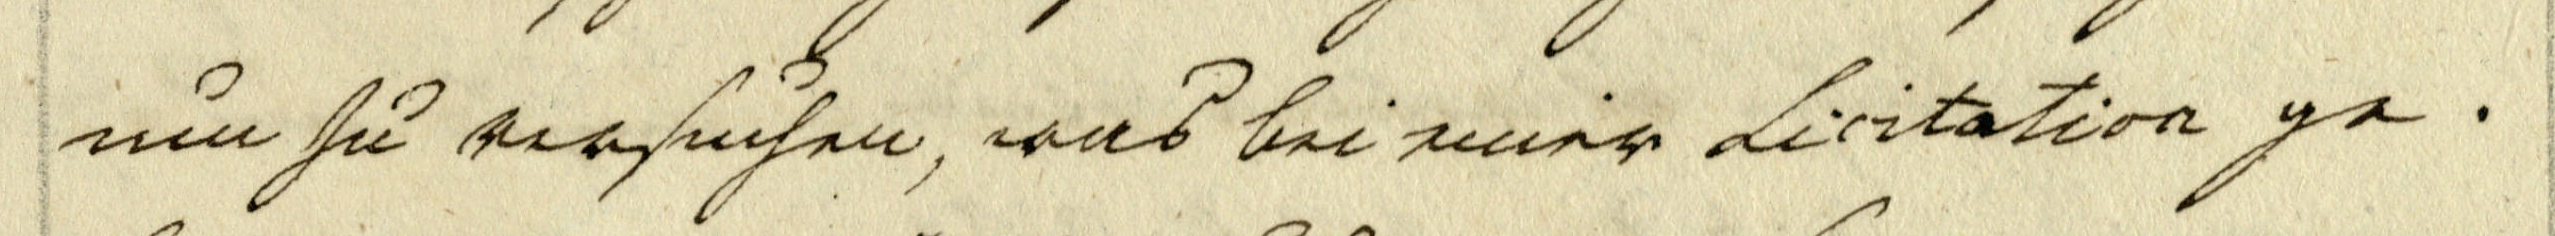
um zu versuchen, was bei einer Licitation ge¬
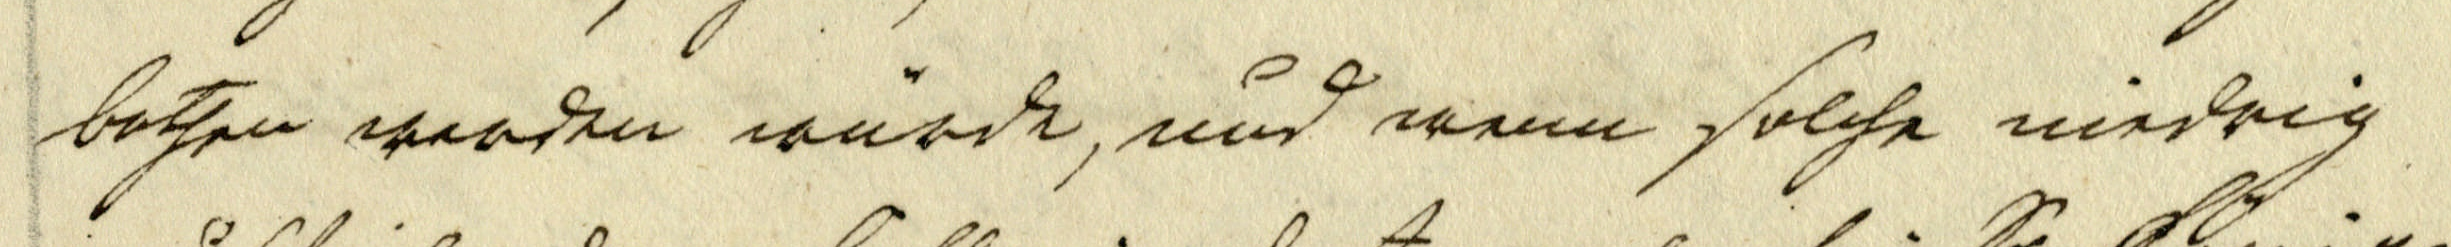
bothen werden würde, und wenn solche niedrig
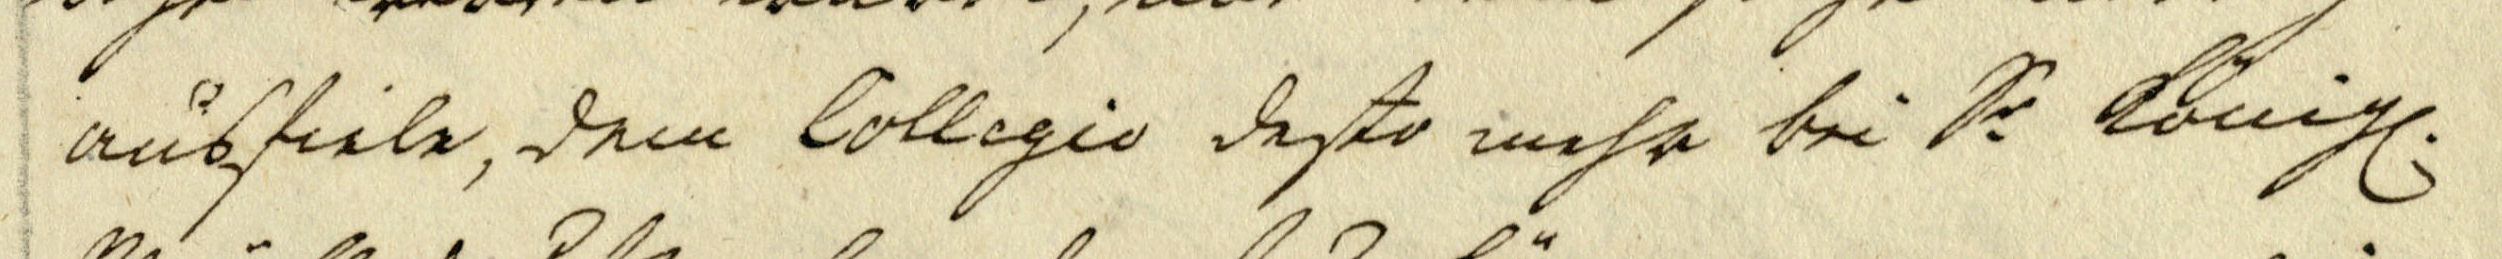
aufiele, dem Collegio desto mehr bei Sr Königl.
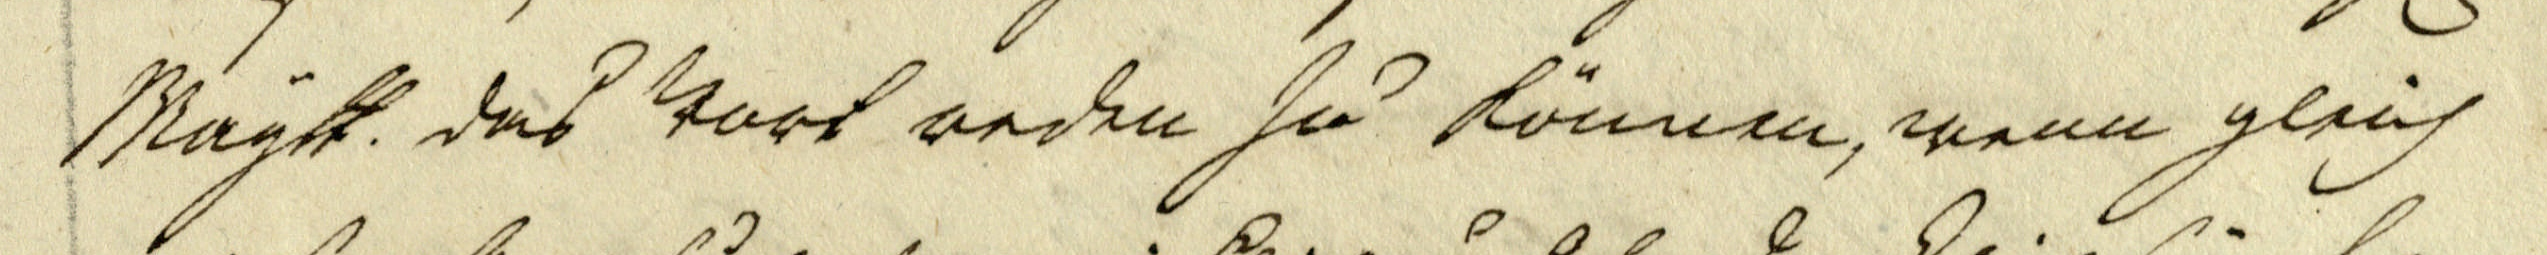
Maÿtt. das Wort reden zu können, wenn gleich
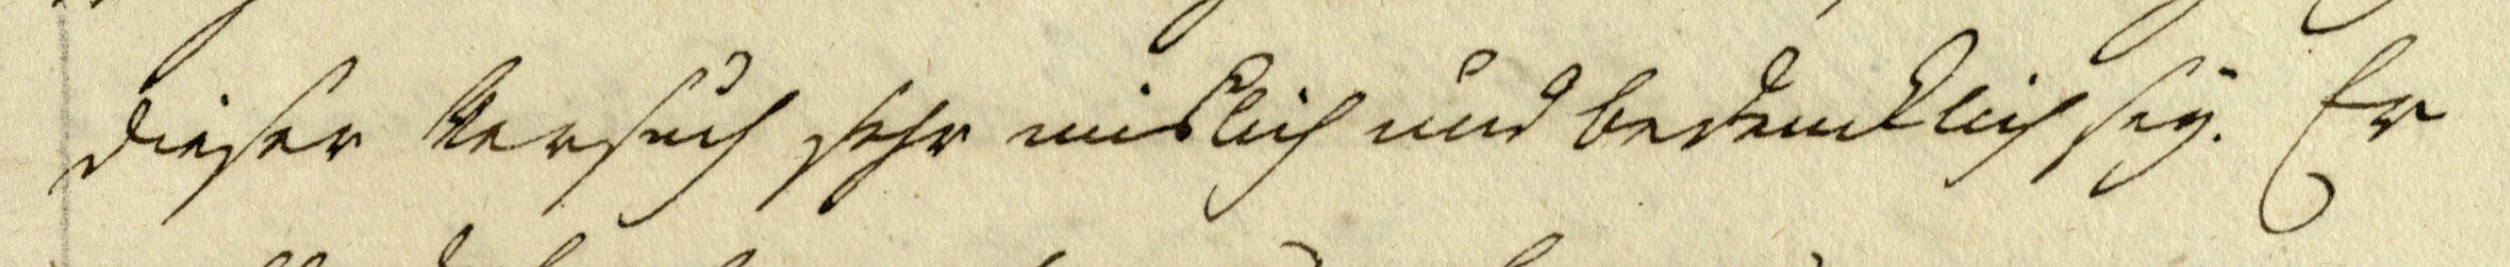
dieser Versuch sehr mislich und bedencklich seÿ. Er
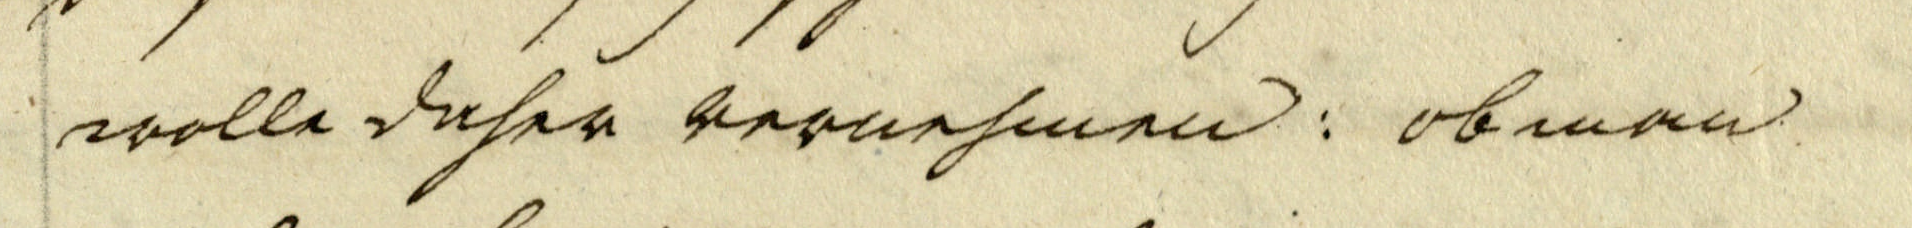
wolle daher vernehmen: ob man
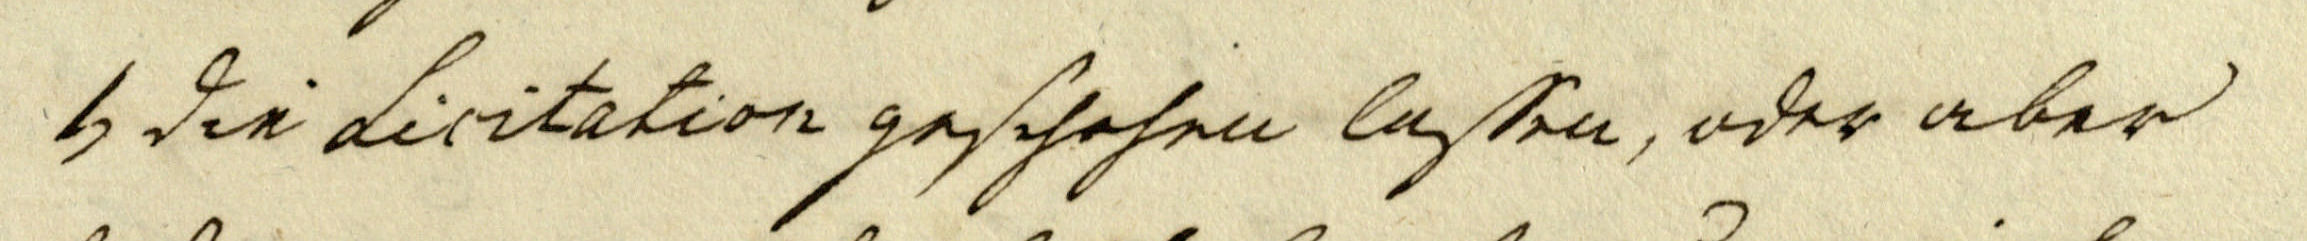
1., die Licitation geschehen lassen, oder aber
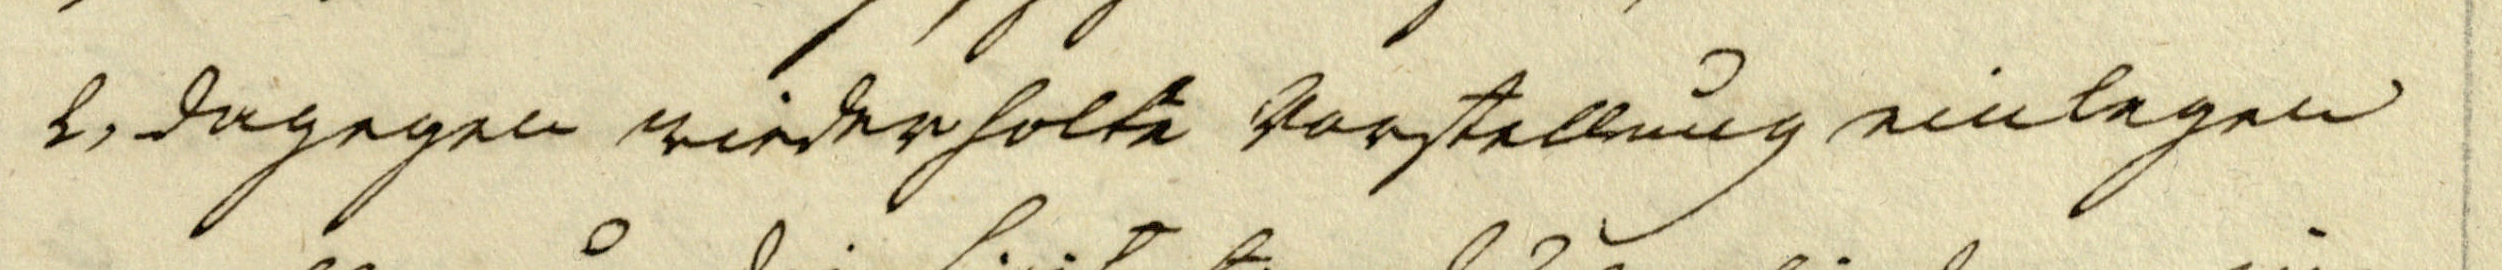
2, dagegen wiederholte Vorstellung einlegen
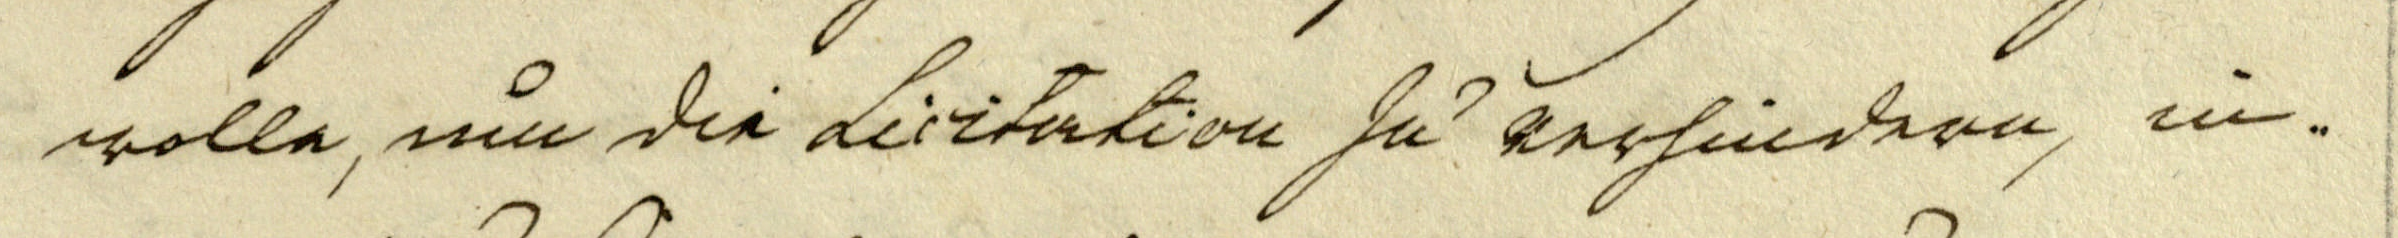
wolle, um die Licitation zu verhindern, in¬
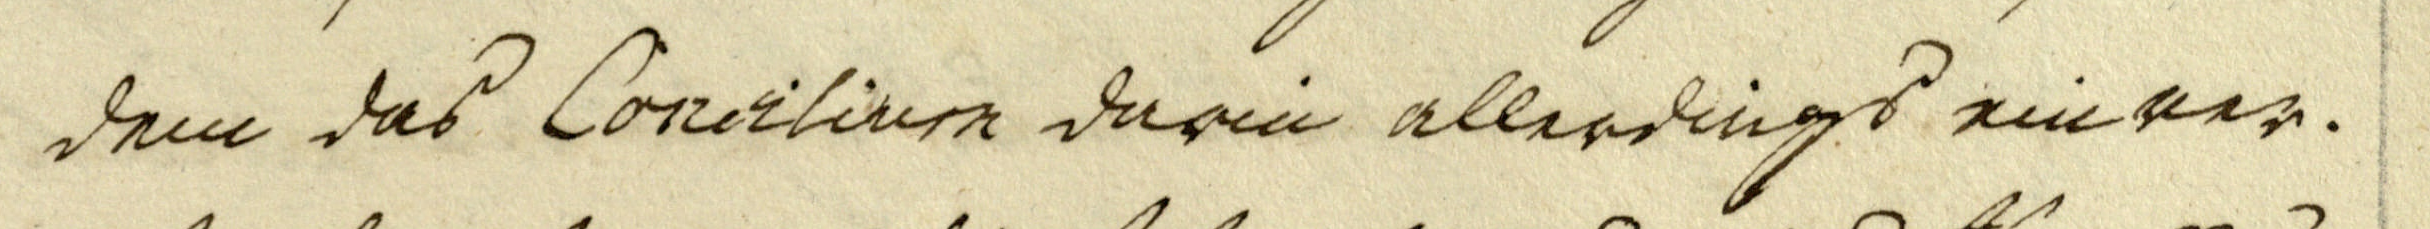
dem das Concilium darin allerdings einver¬
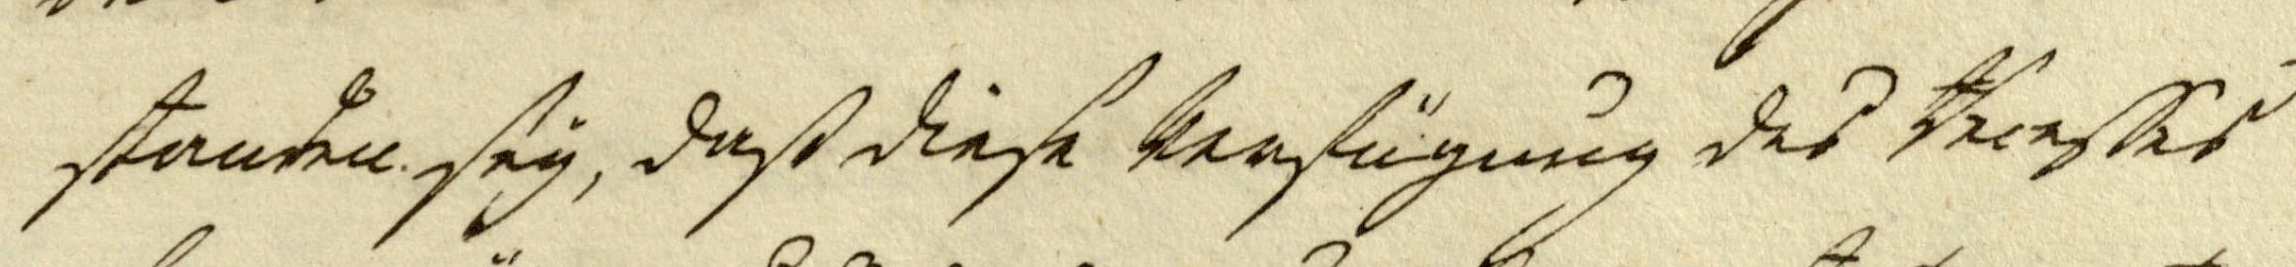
standen seÿ, daß diese Verfügung des Recesses
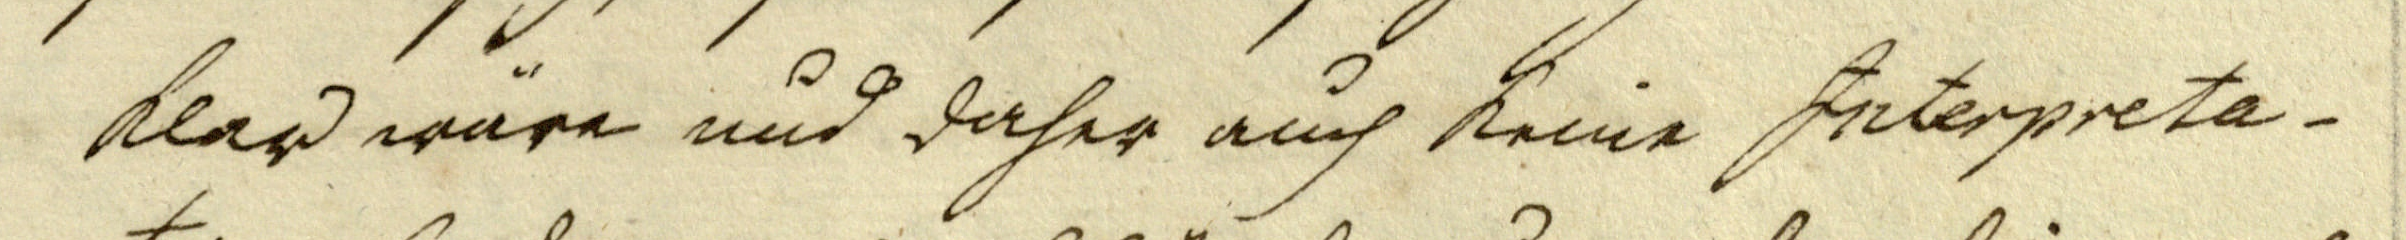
klar wäre und daher auch keine Interpreta¬
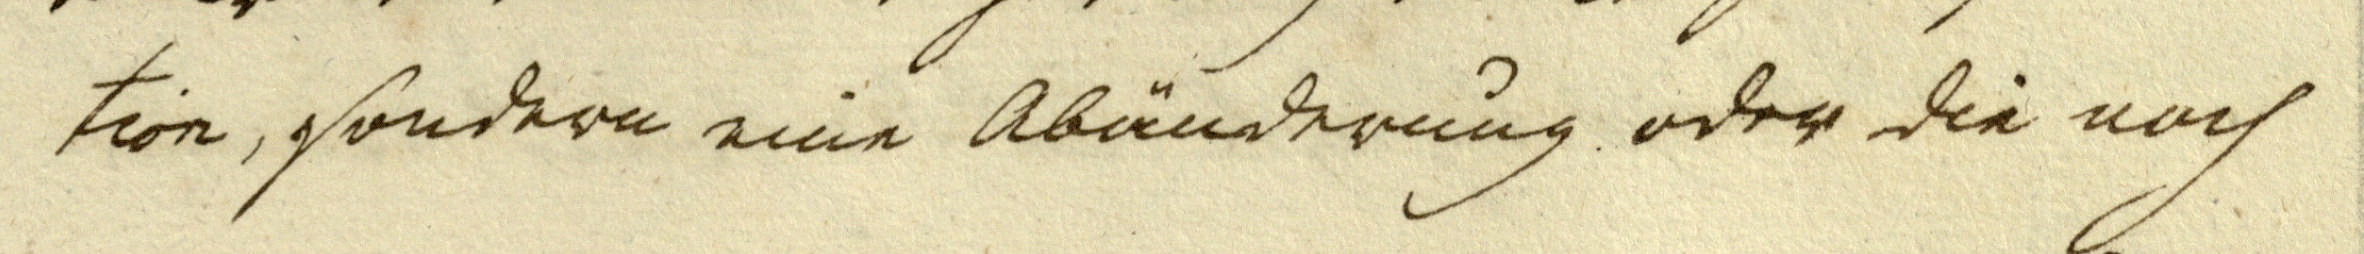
tion, sondern eine Abänderung oder die noch
